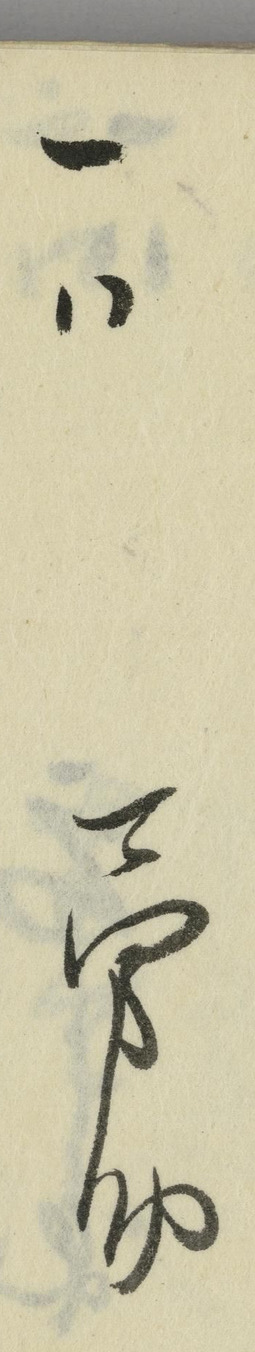一同勇助
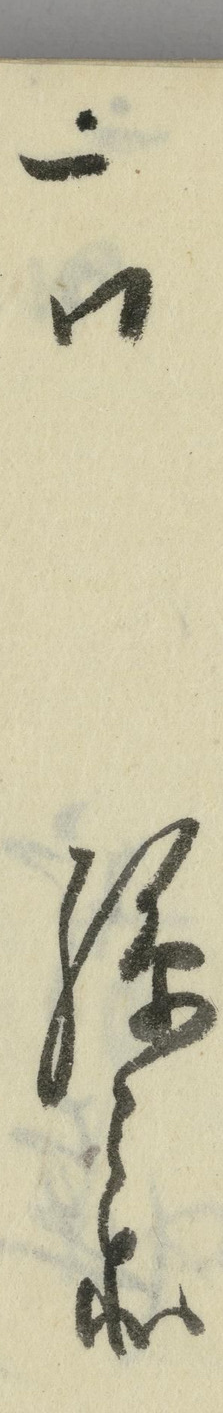一同弥兵衛
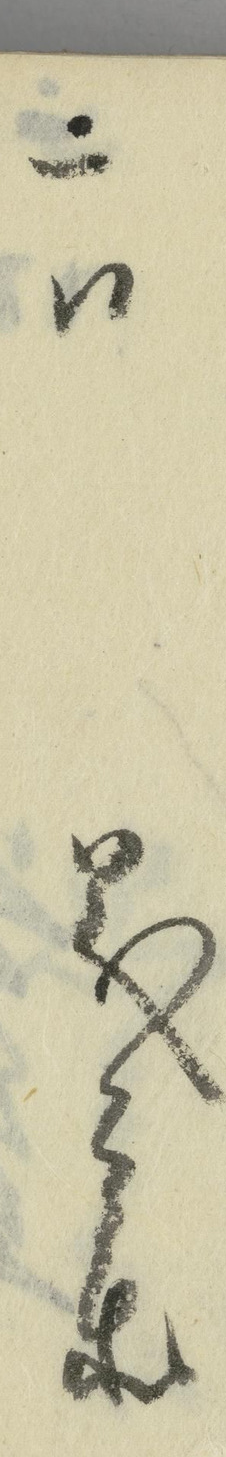一同弥兵衛
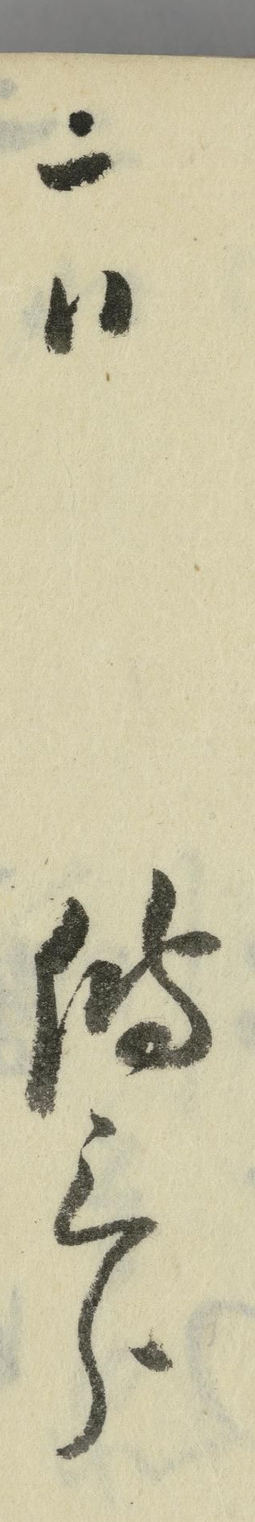一同伝三郎
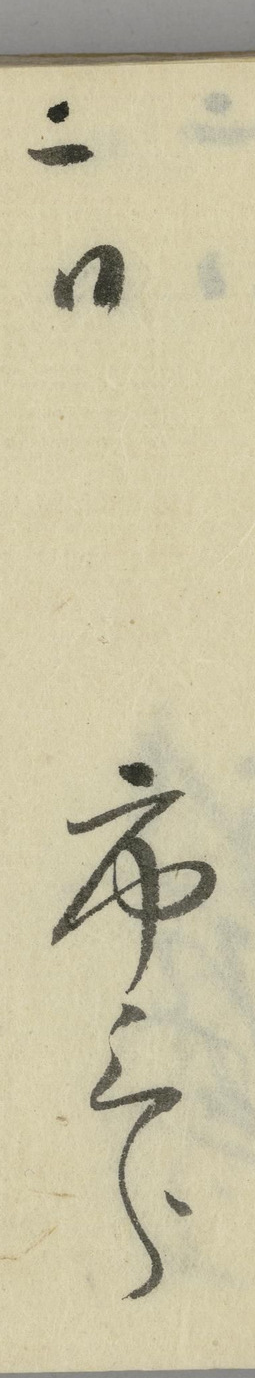一同伝三郎

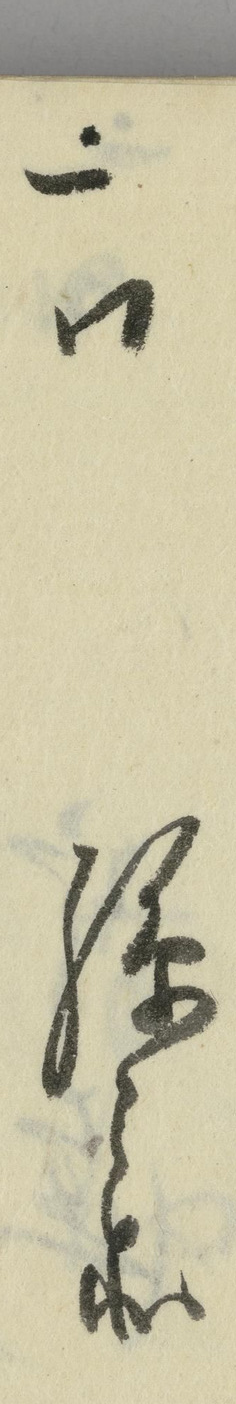一同与兵衛
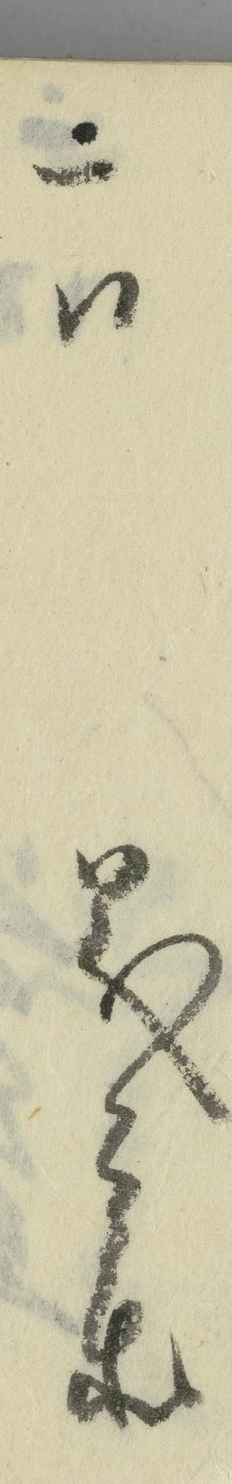一同与兵衛
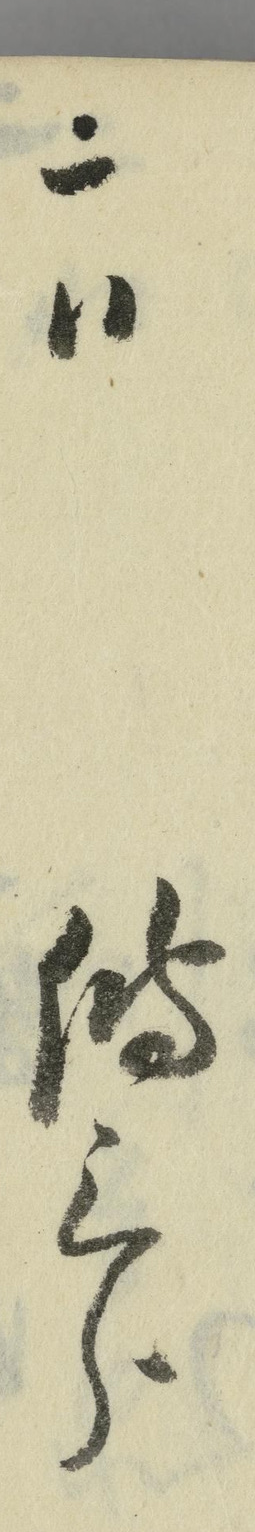一同市三郎
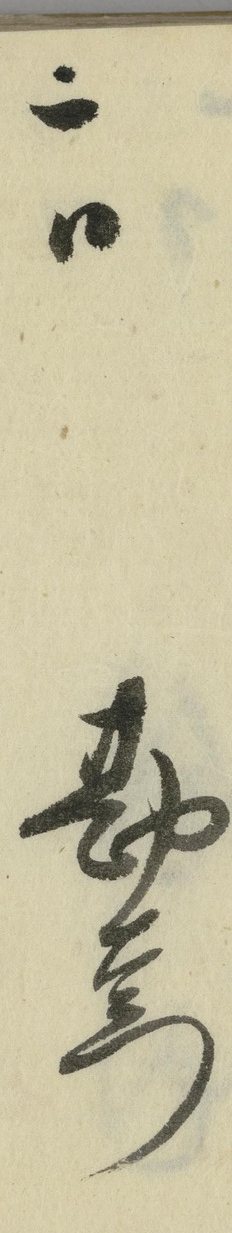一同勘右衛門
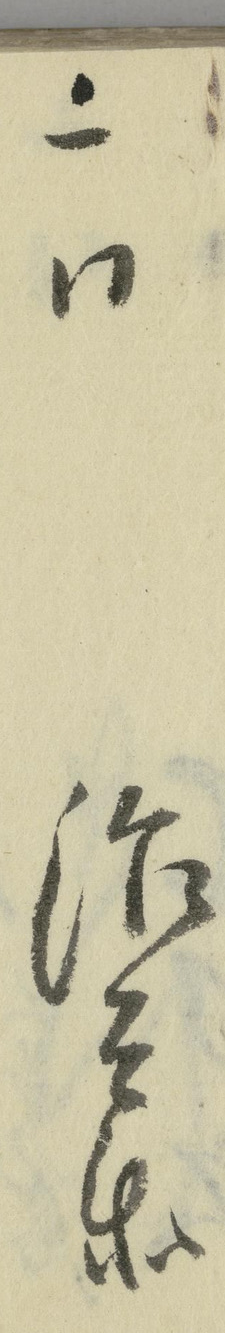一同与兵衛
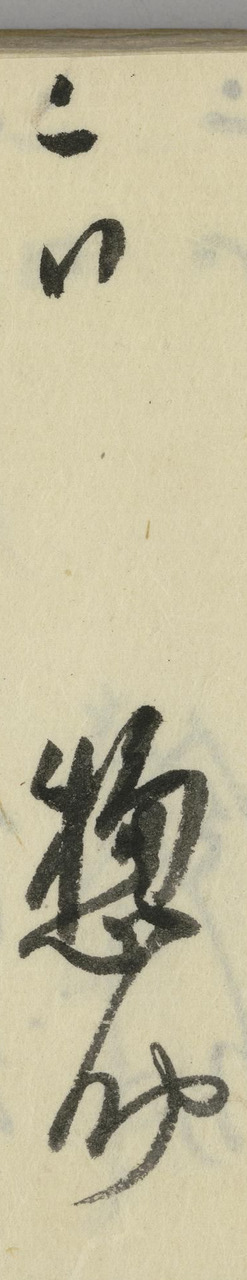一同惣助
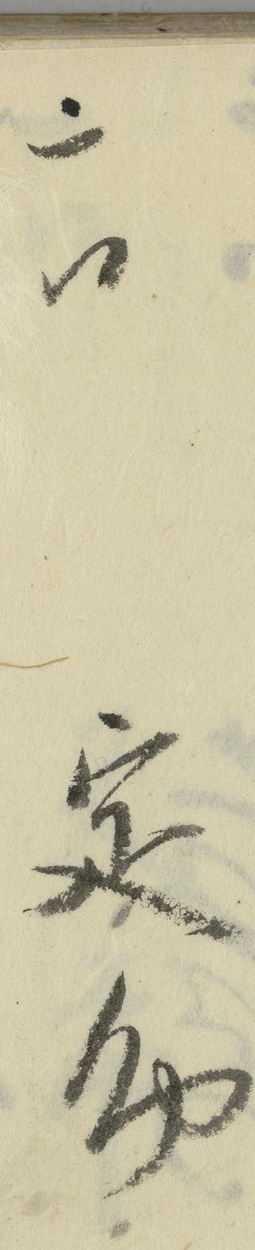一同定助
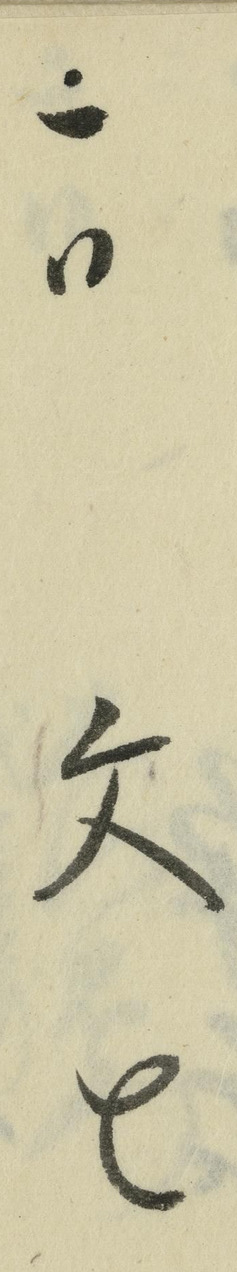一同文七
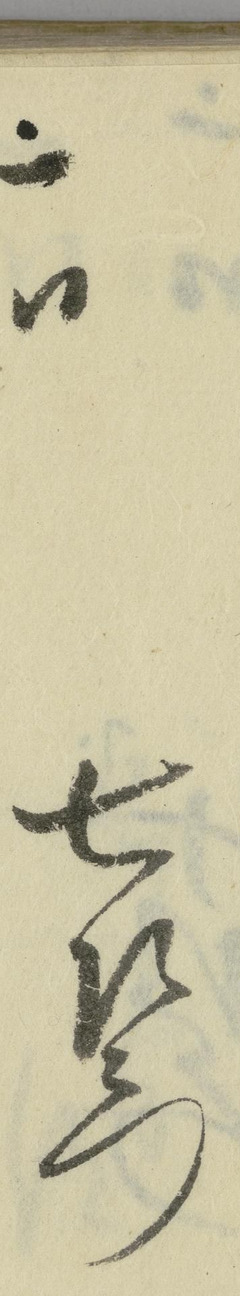一同七左衛門
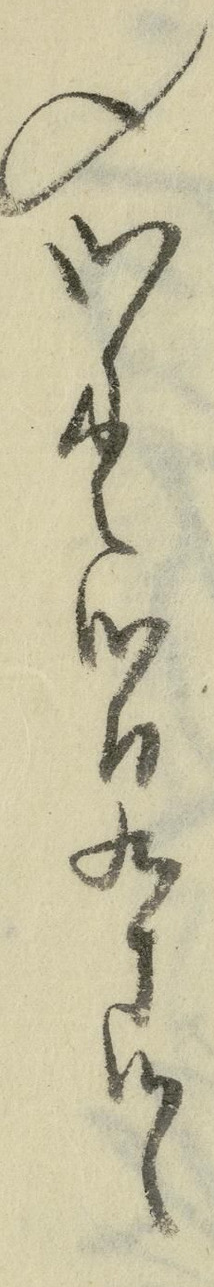〆弐貫弐百九十二文

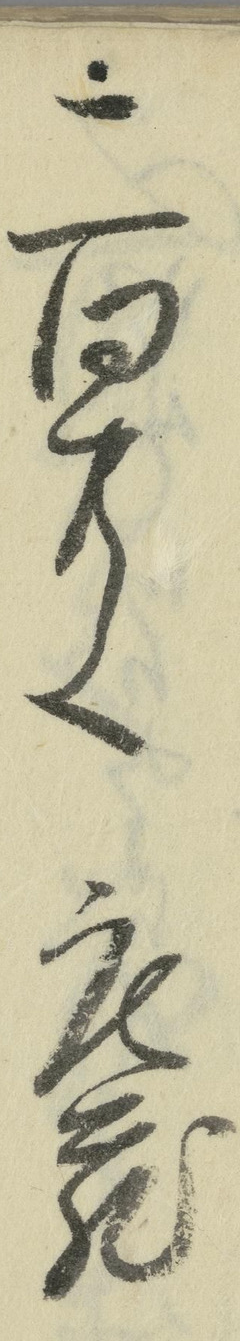一百廿文庄蔵
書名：天明淺間噴火ニ関スル書類
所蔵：東京大学地震研究所図書室 Earthquake Research Institute Library, The University of Tokyo, JAPAN
